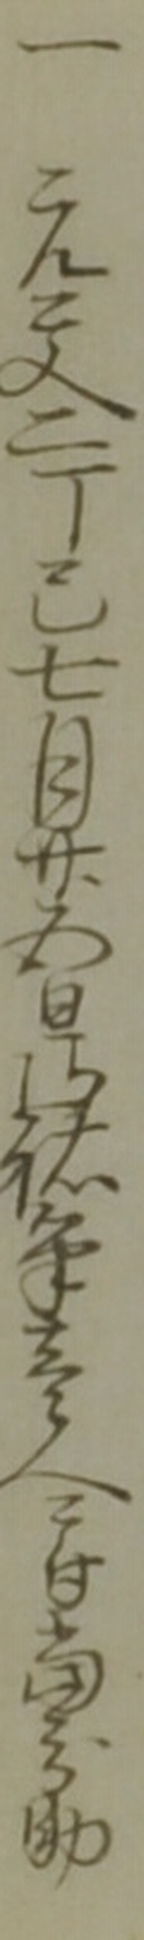一元文二丁巳七月廿五日御祐筆壱人ニ付当分助
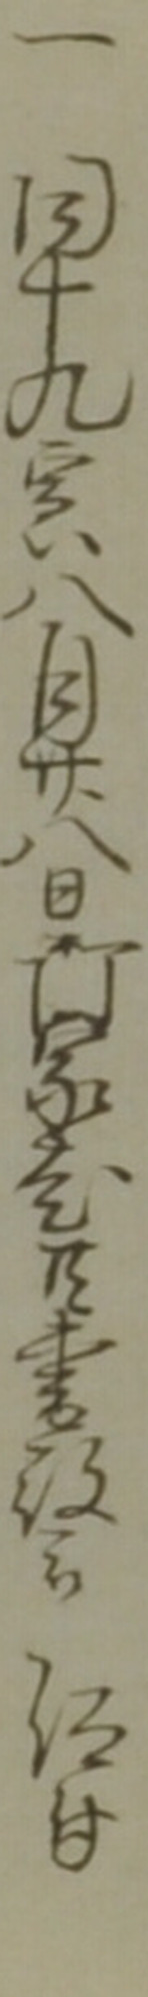一同十九寅八月廿八日御家老共書役被仰付
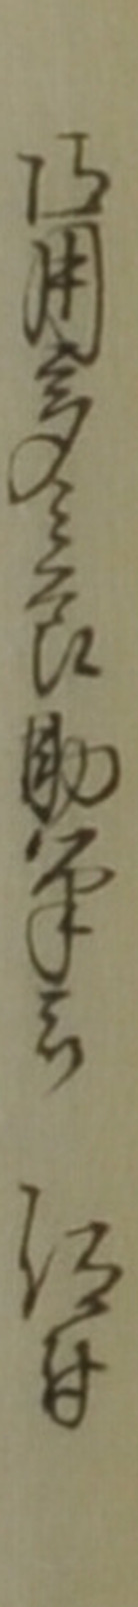御用多之節助筆被仰付
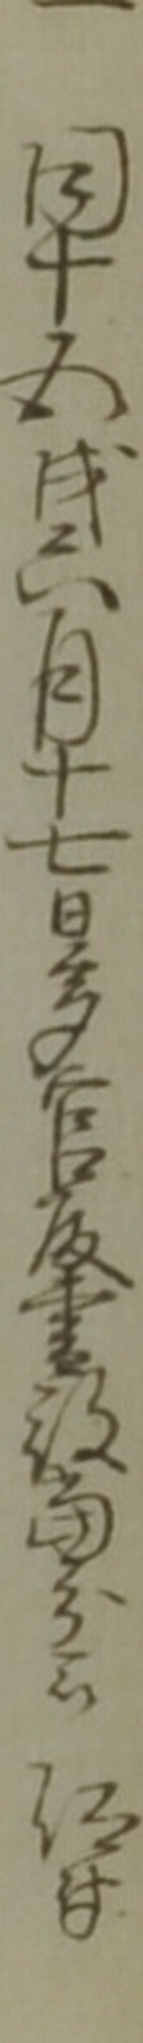一同十五戌六月十七日多宮殿書役当分被仰付
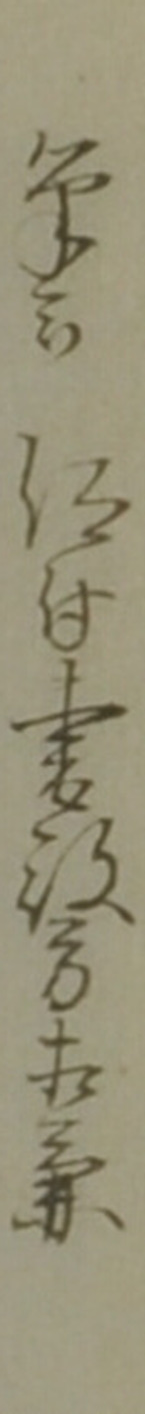筆被仰付書役方相兼
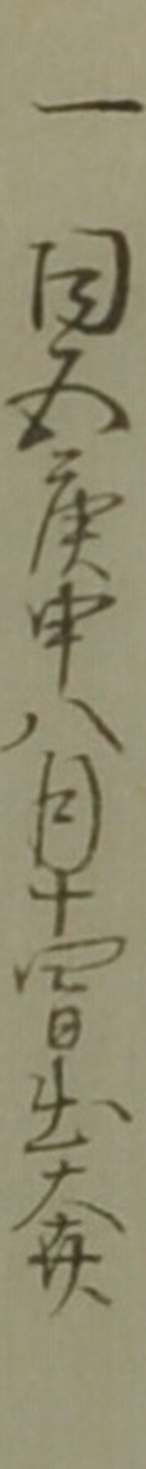一同五庚申八月十四日出奔
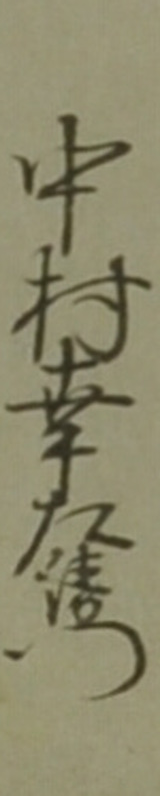中村幸左衛門

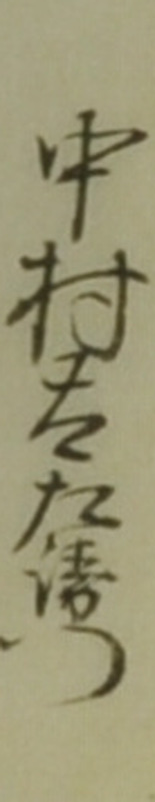中村太左衛門
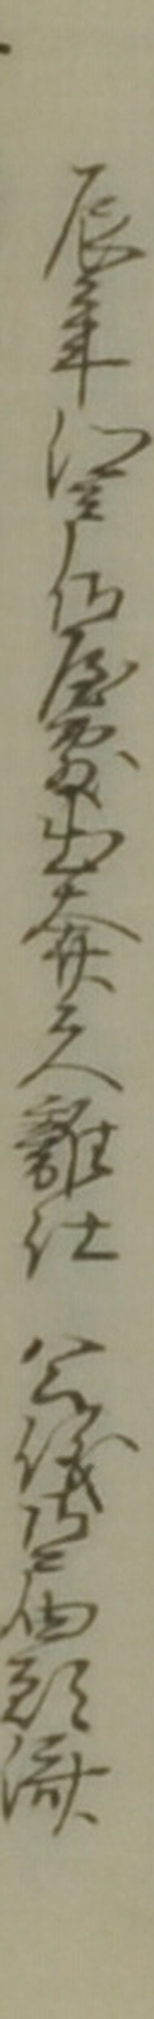辰年江戸御屋敷出奔久離仕公儀御届願済
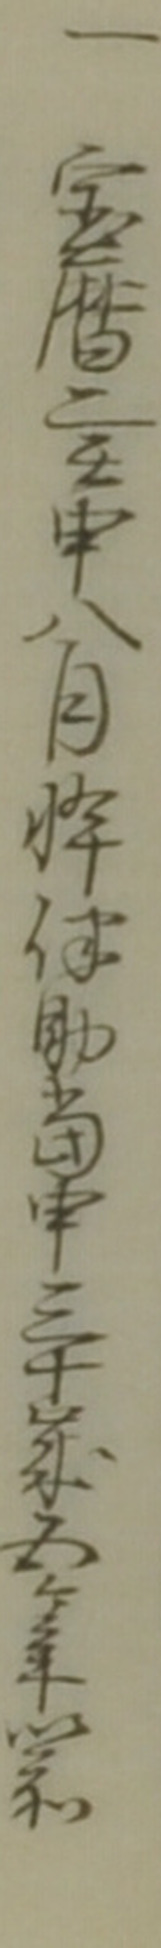一宝暦二壬申八月忰伴助当申三十歳五ヶ年以前
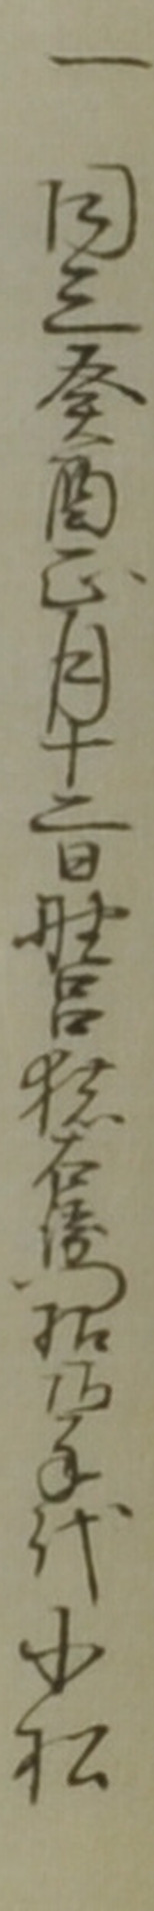一同三癸酉正月十二日野呂猪右衛門様御手代小松

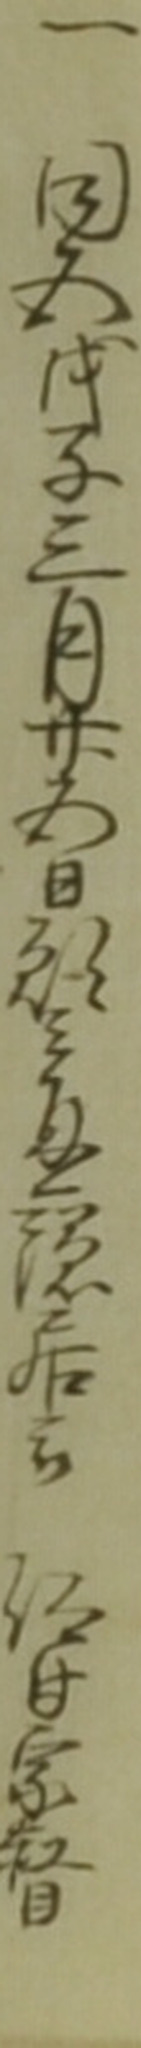一同五戊子三月廿五日願之通隠居被仰付家督
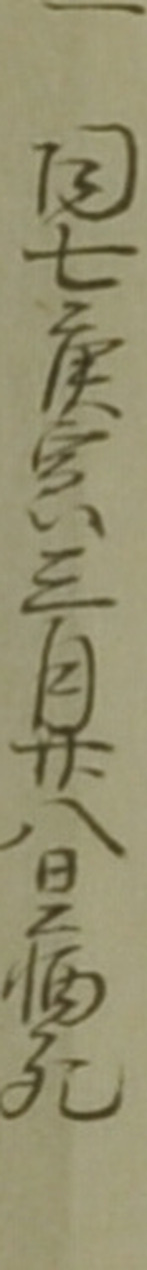一同七庚寅三月廿八日病死
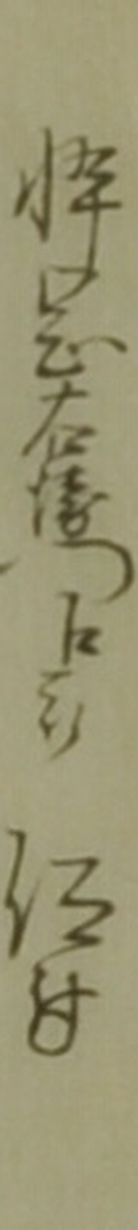忰岡右衛門江被仰付
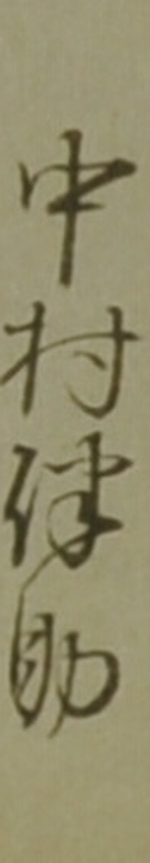中村伴助
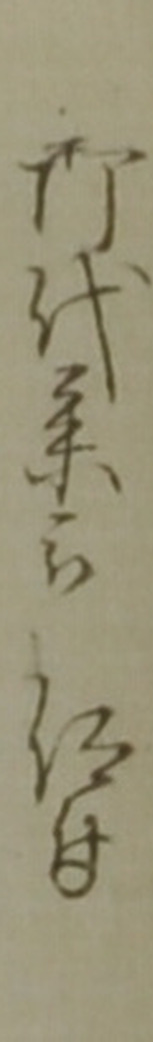御代参被仰付
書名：無足廃家（弐）
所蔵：伊那市立高遠町図書館・合同会社AMANE
